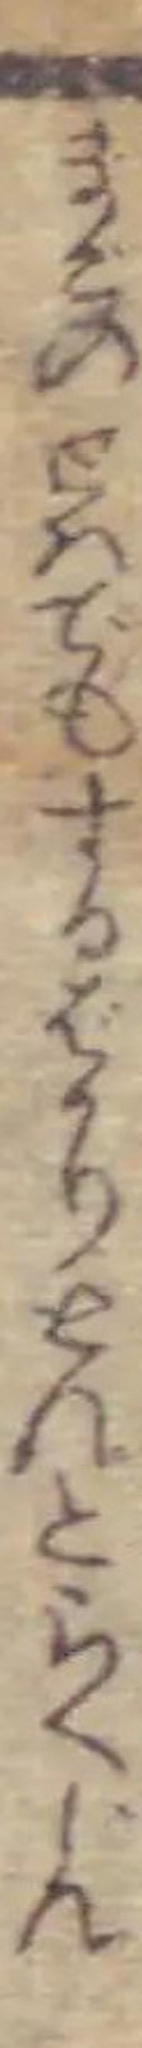まごのせはでもするばかりとんとらくしん
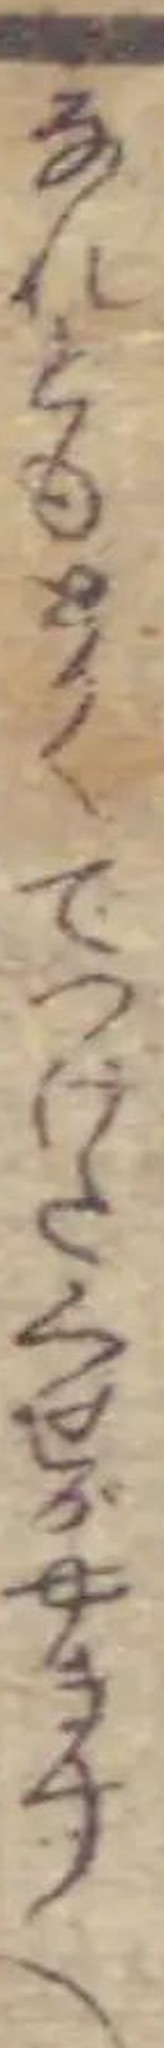なれともとかくでつけたくせがやます
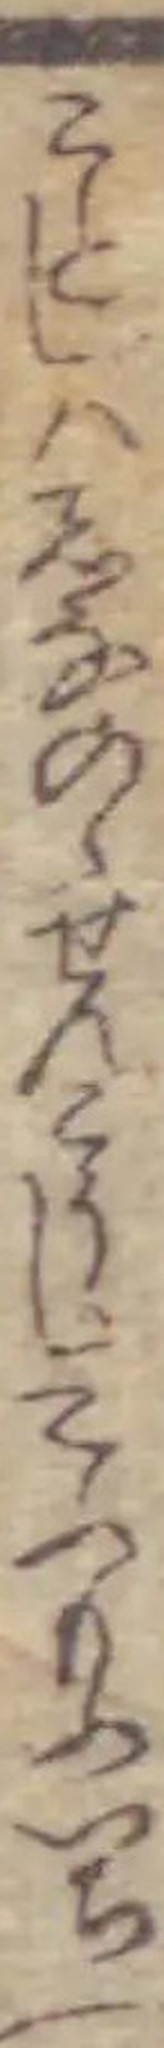ことしはしなのゝせんこうじてふもふいち
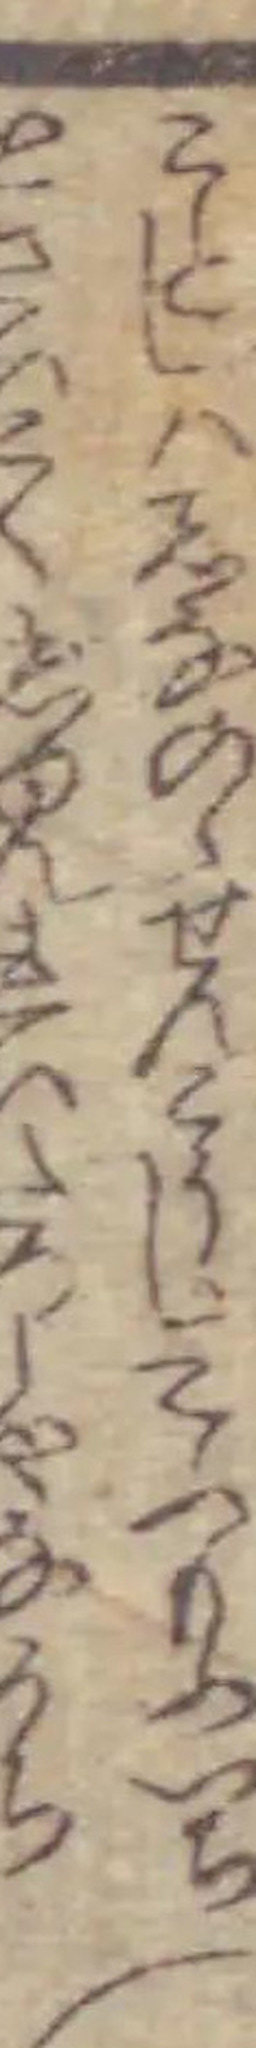とさいこくじゆんれいたつしやなうち
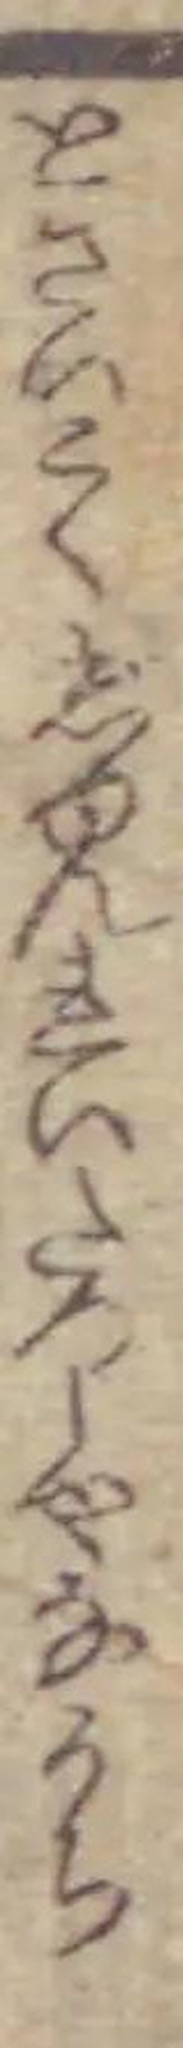とさいこくじゆんれいたつしやなうち
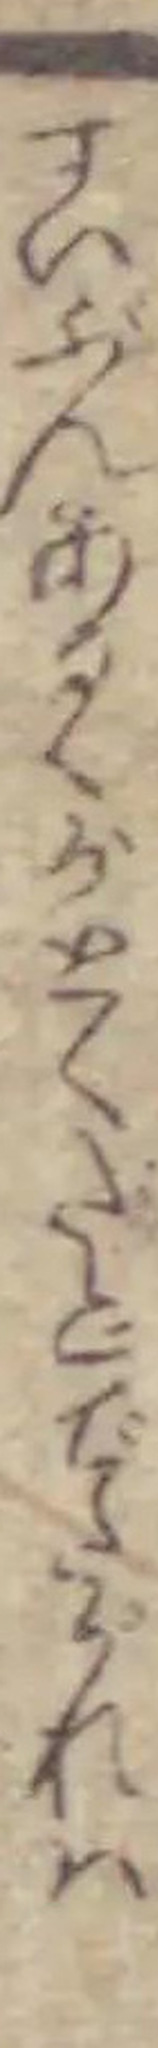ずいぶんあるくがとくだとでたがれは
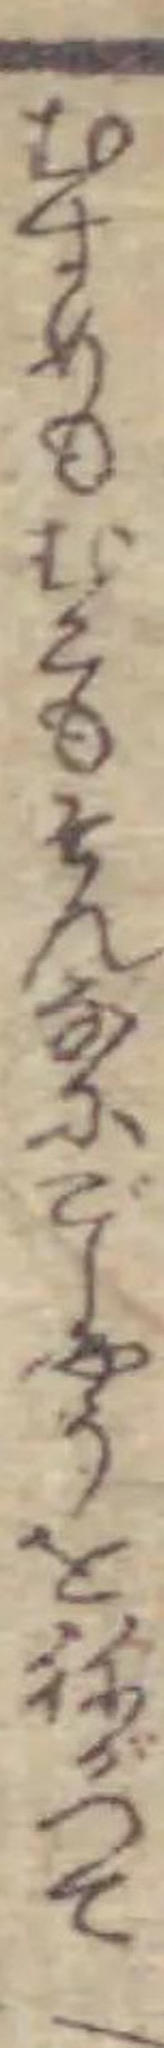むすめもむこもそんなにごしやうをねがつて
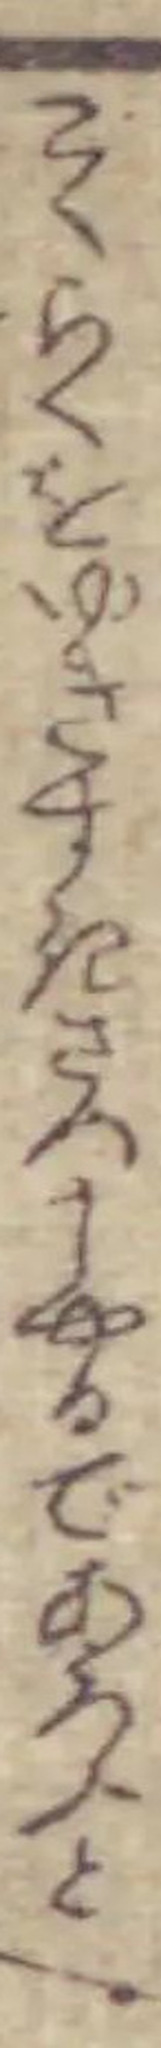こくらくをゆきすきさつしやるであろふと
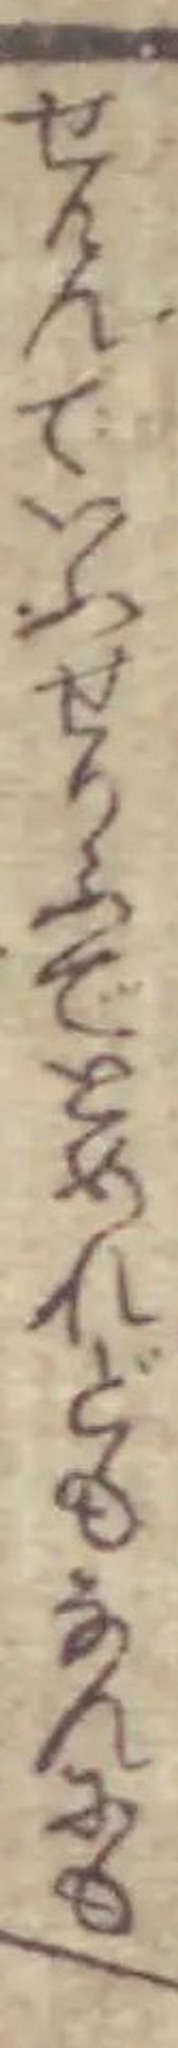せけんでいふせりふでとめれどもなんにも
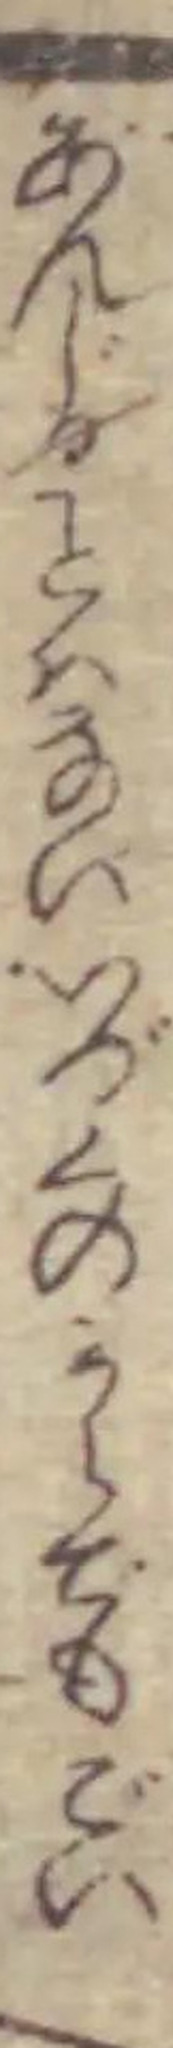あんじることはないいづくのそらでもごい
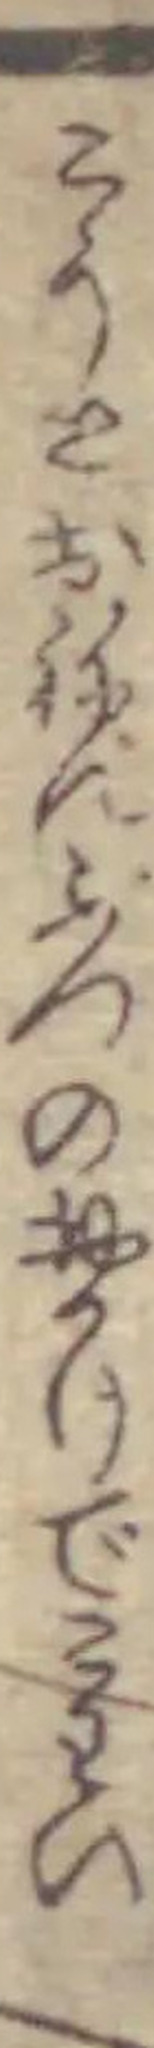こうとおねんぶつのおかけでこわい
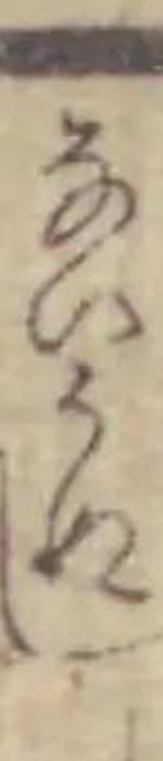ないうぬし
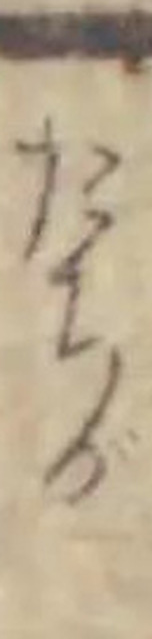たちが
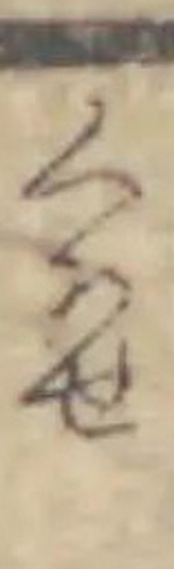くはせ
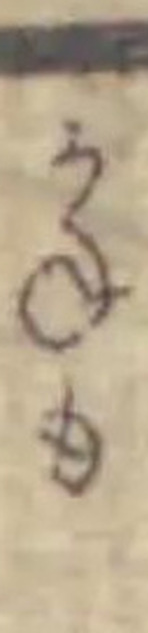かねも
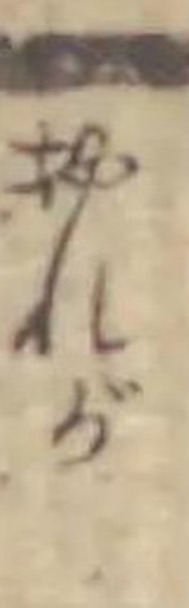おれが
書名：もふもふもふ怖噺 2巻
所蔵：国立国会図書館 National Diet Library, JAPAN
